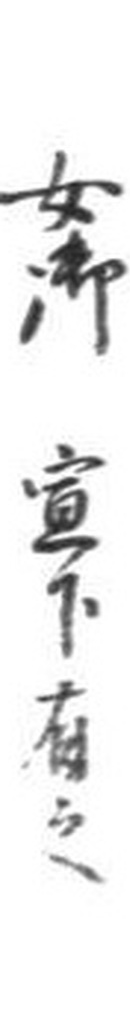女御宣下有之
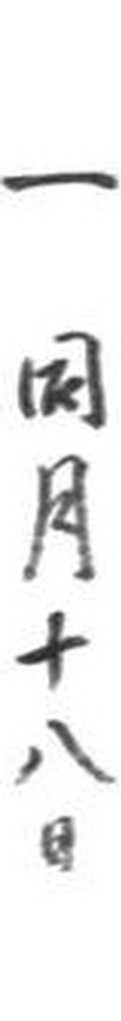一同月十八日

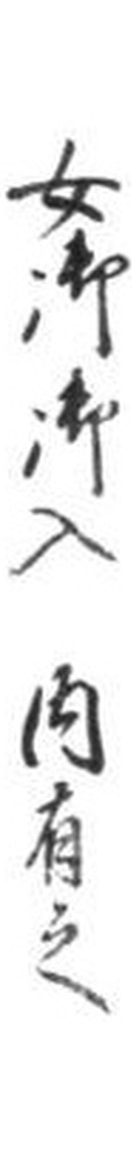女御御入内有之
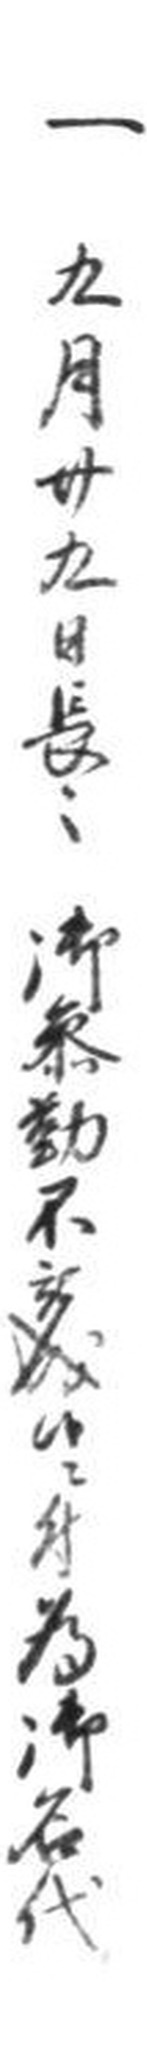一九月廿九日長々御参勤不被成候ニ付為御名代
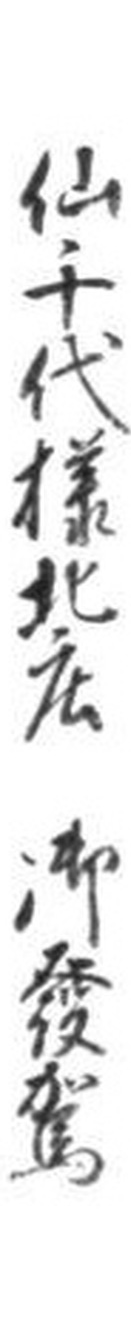仙千代様北庄御発駕
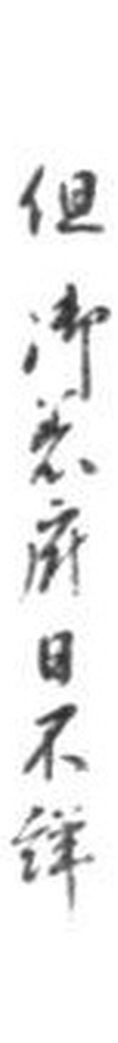但御着府日不詳
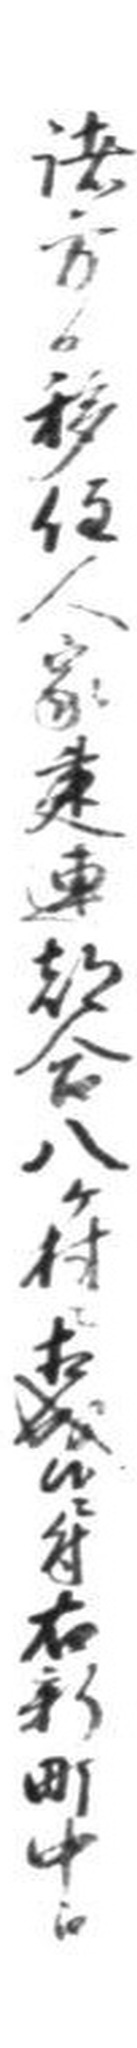諸方ゟ移住人家建連都合八ケ村ニ相成候ニ付右新町中江
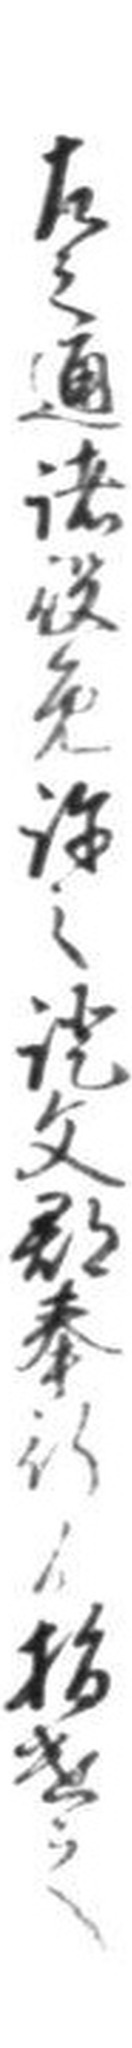左之通諸役免許之証文郡奉行ゟ指遣之
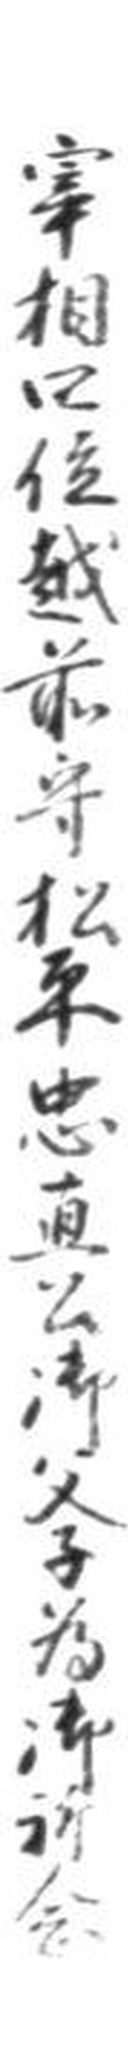宰相四位越前守松平忠直公御父子為御祈念
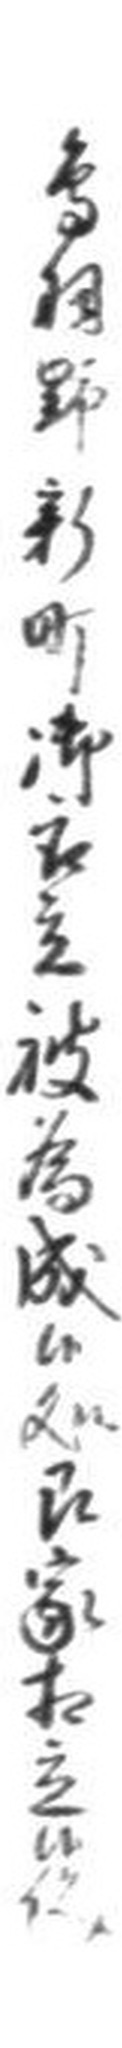鳥羽野新町御取立被為成候処即家相立候儀
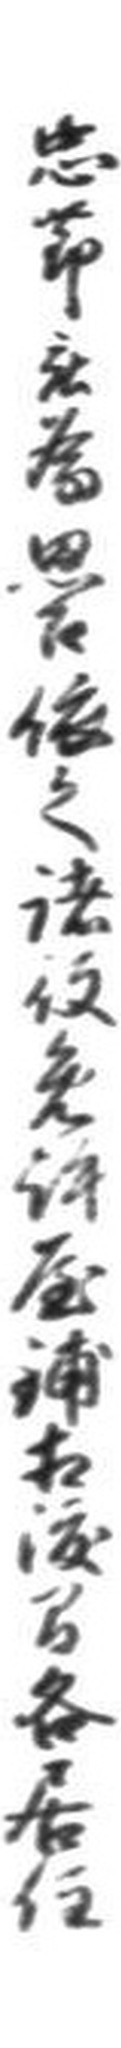忠節被為思召依之諸役免許屋鋪相渡間各居住
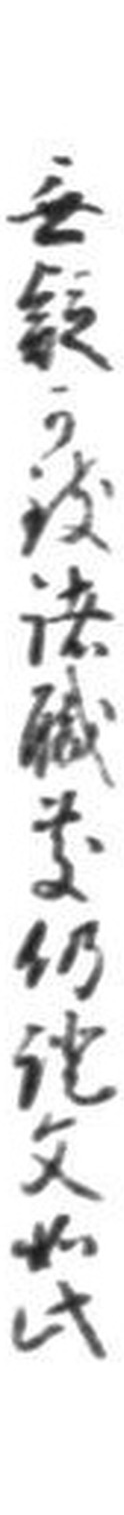無疑可致諸職処仍証文如此
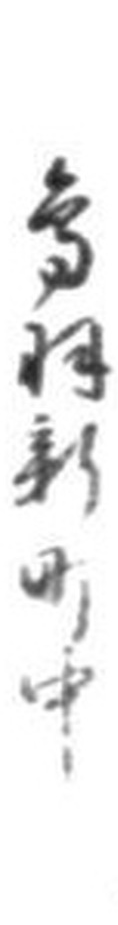鳥羽新町中

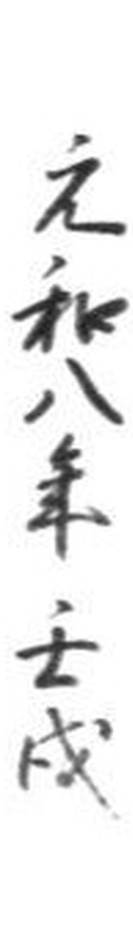元和八年壬戌
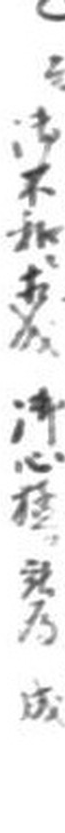御不和ニ相成御心猛ク被為成
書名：家譜 二 忠直公 従文禄四年到慶安四年
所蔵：福井県文書館 Fukui Prefectural Archives
